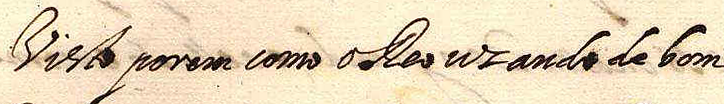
Visto porem como o Reo uzando de bom
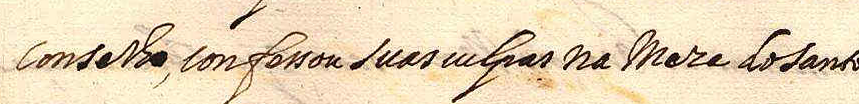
conselho, confessou suas culpas na Meza do santo
